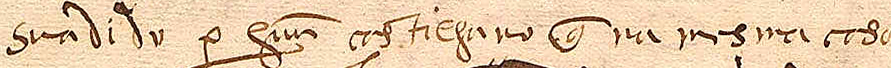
suadido ꝑ hu̅u castilhano q̅ na mesma casa
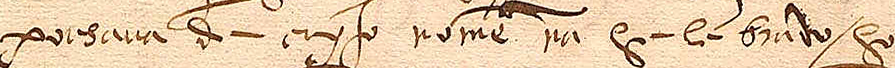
pousaua de cuyjo no̅me n̅a he le̅brado / ho
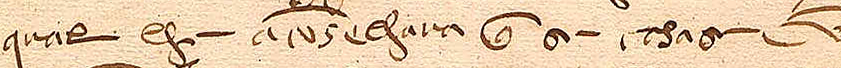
quaL lhe a̅coselhaua q̅ se casase c̅o
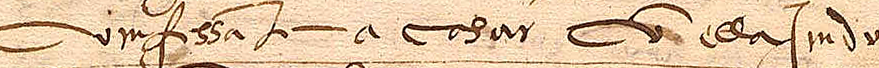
Comfess̅ate a casar Cō ella Jmdo
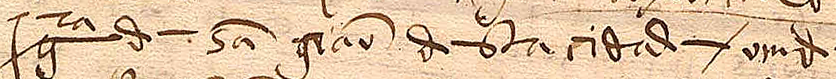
Jgra de s̅a giaõ desta cidade / omde
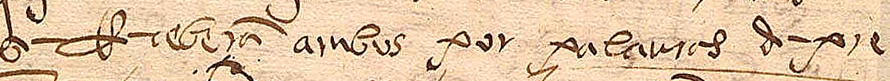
se Recebera̅ ambos por palauras de pre
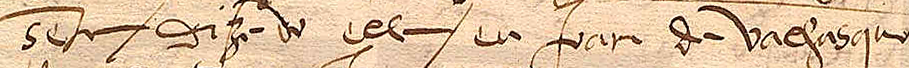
s̅ete / diz̅edo elle / eu Joam de Valhasquo
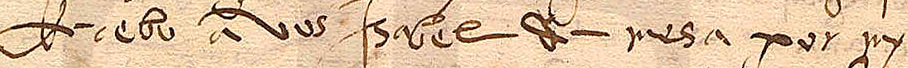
Recebo a vos JsabeL de mesa por my
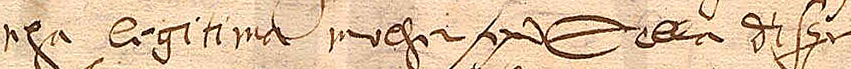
nha legitima molher e c̅ꝭ E ella disse
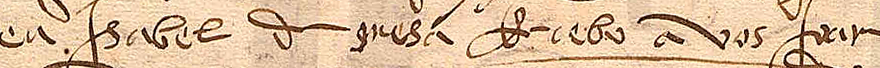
eu JsabeL de mesa Recebo a vos Joam
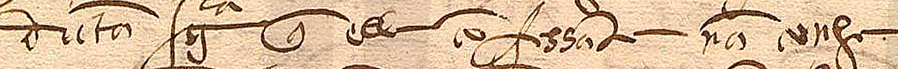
di̅cta Jg̅ra q̅ elle c̅ofessa̅te n̅a conhe
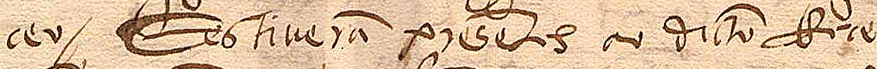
ceo / E estiuera̅ pres̅etes ao di̅cto Rece
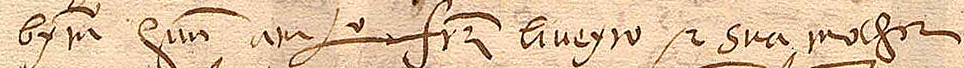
bymo hu̅u amto fr̅z liueyro e sua molher
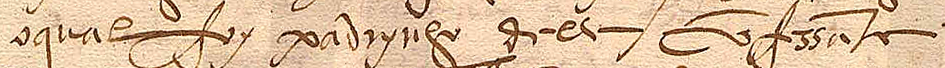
o qual foy padrynho delle / C̄ofess̅ate
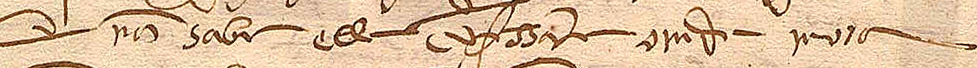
e n̅a sabe elle c̅ofessa̅te omde mora
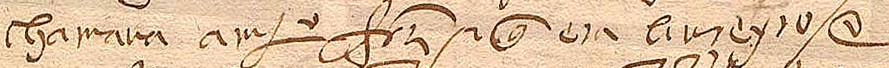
chamaua amto fr̅z e q̅ era liureyro / e
